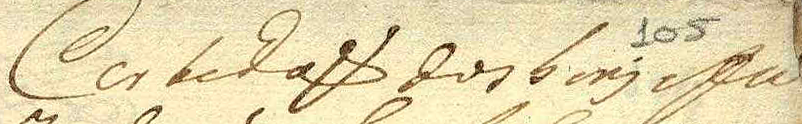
Certidaõ dos bens e fa
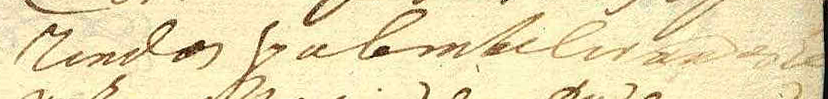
Zendas q̄ aComteCeram a the
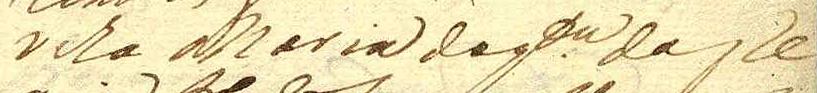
reZa Maria da q.ta da pre
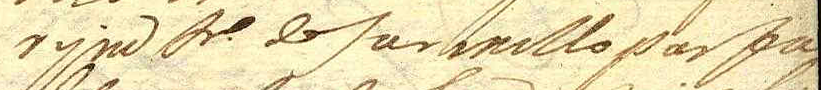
reyra tr.o do Jarmello por fa
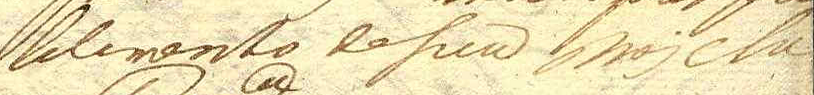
leCemento de sua maj cla
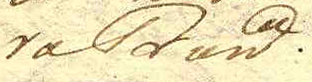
ra Fran.ca
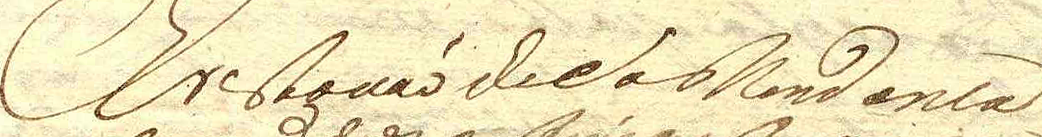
Chrestouaõ de Sa Mendonca
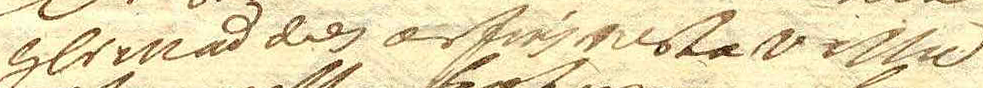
escriuaõ dos orfons nesta villa
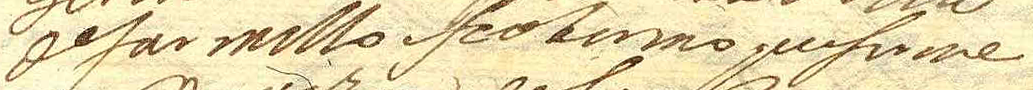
de Jarmello e seo termo que serue
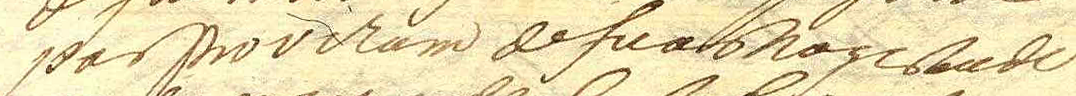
por provizam de sua Magestade
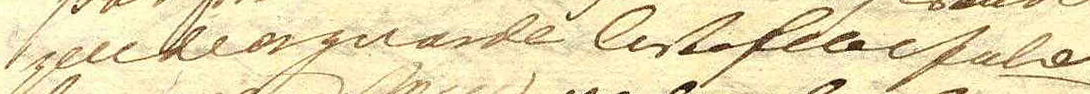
que deos guarde Certefico e faco
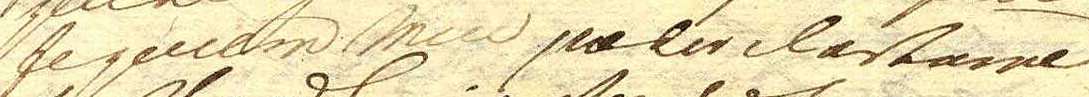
fe que em meu poder e Cartorio
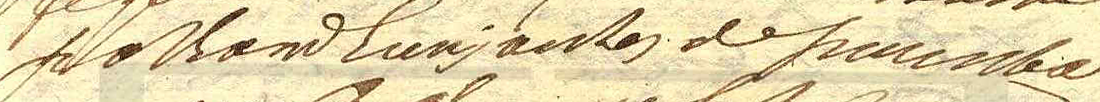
se acham huns autos de Jnuenta
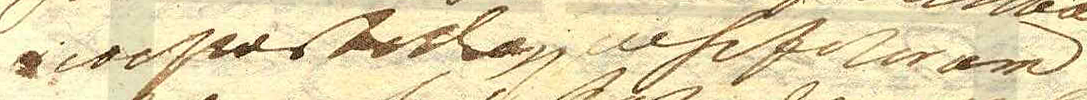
rio e pertilhas que se fizeram
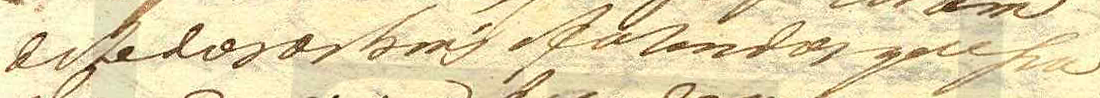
de todos os bens e fazendas que se a
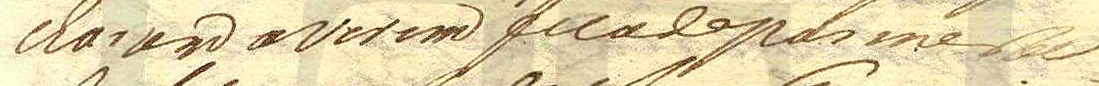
charam averem ficado por morte
